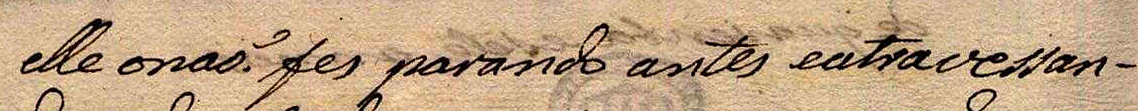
elle o naõ fes parando antes e atravessan
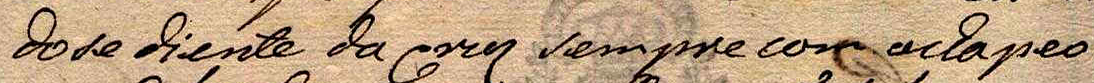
dose diante da Crus sempre com o chapeo
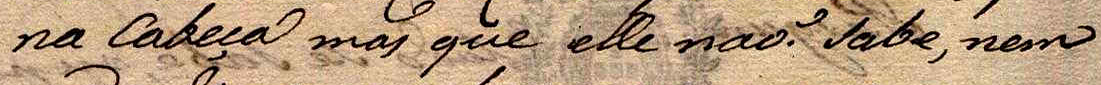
na Cabeça mas que elle naõ sabe, nem
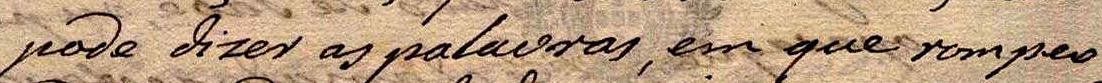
pode dizer as palavras, em que rompeo
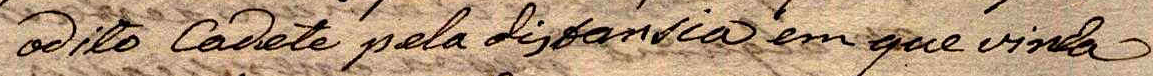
o dito Cadete pela distansia em que vinha
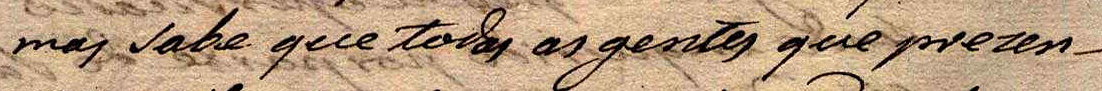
mas sabe que todas as gentes que prezen
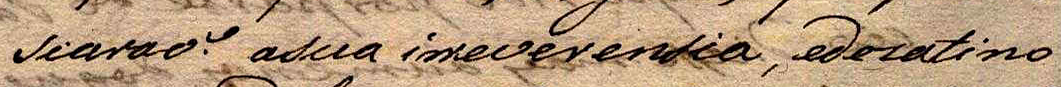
siaraõ. a sua irreverensia, e dezatino
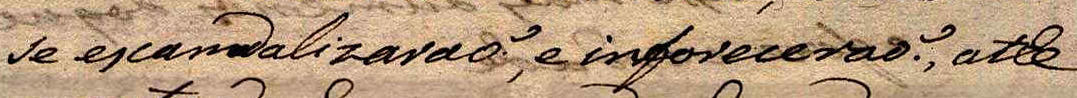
se escandalizaraõ, e inforeceraõ, athe
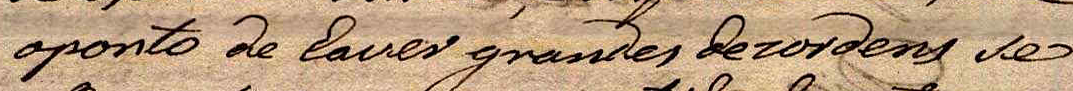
o ponto de haver grandes dezordens se
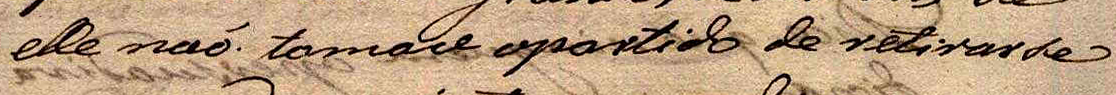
elle naõ tomace o partido de retirarse
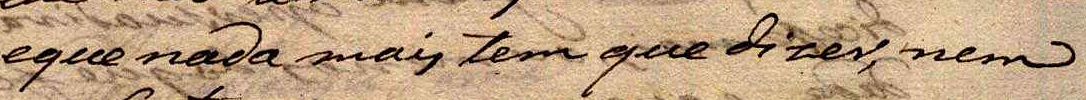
e que nada mais tem que dizer, nem
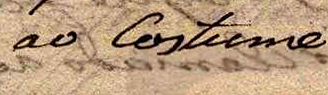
ao Costume
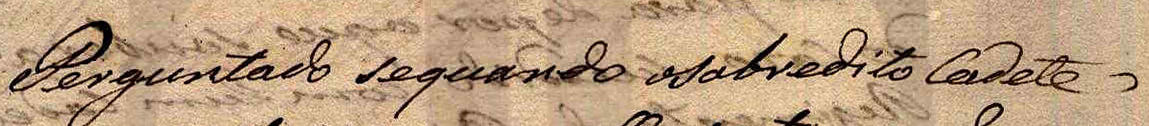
Perguntado se quando o sobredito Cadete
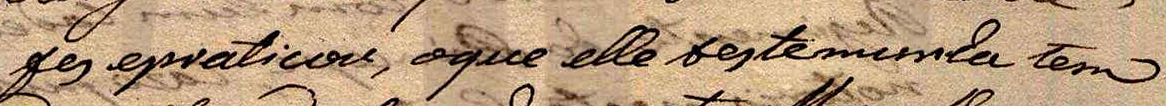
fes e praticou, o que elle testemunha tem
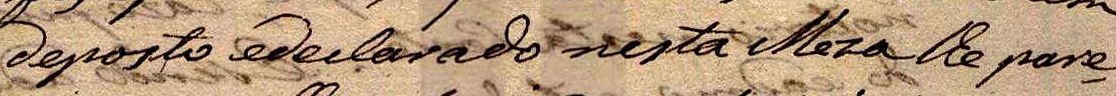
deposto e declarado nesta Meza lhe pare
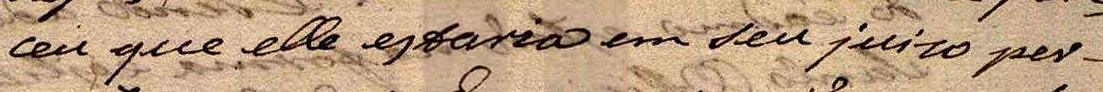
ceu que elle estaria em seu juizo per
